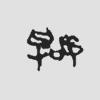興
